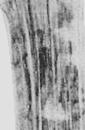神
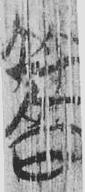○（孰）
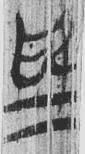爲
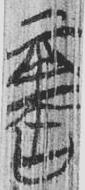啻
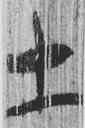土
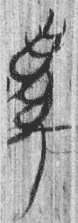○（奚）
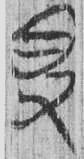○（得）
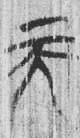而
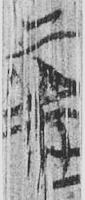坪（平）
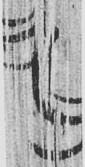水
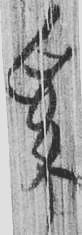○（奚）
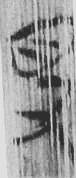○（得）
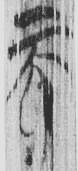而
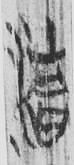清
